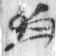於
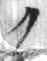人
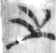之
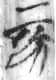所
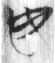母
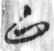㠯（以）
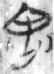舍（予）
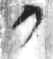人
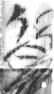貨
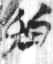於
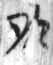外
